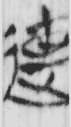連
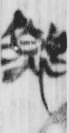囂
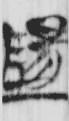○（陽）
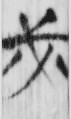必
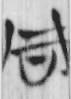同
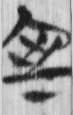室
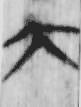大
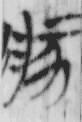痎
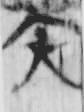內
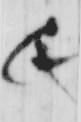氏
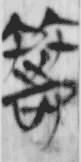等
